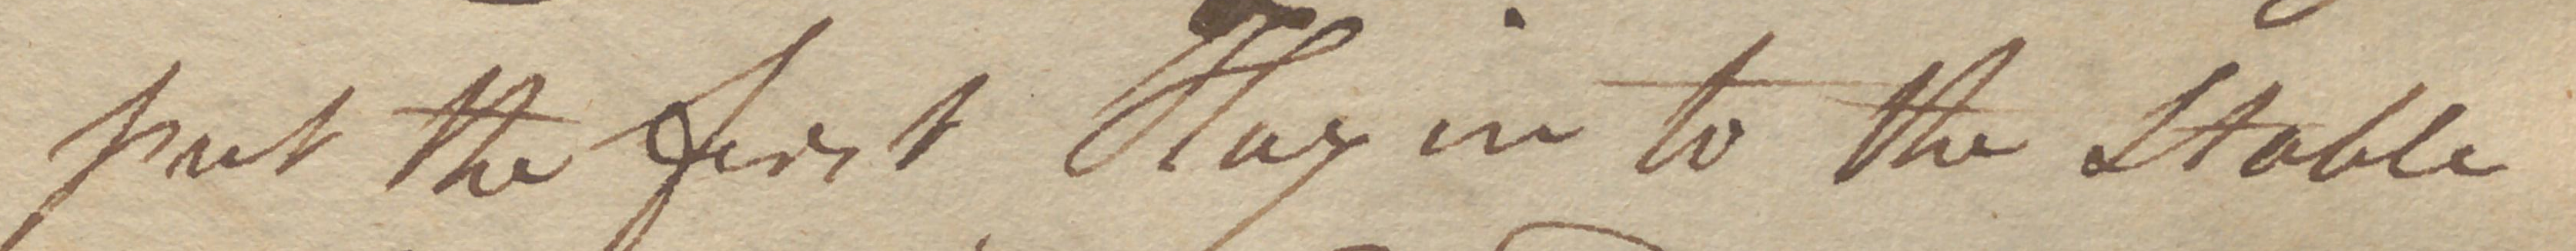put the first Hay in to the Stable
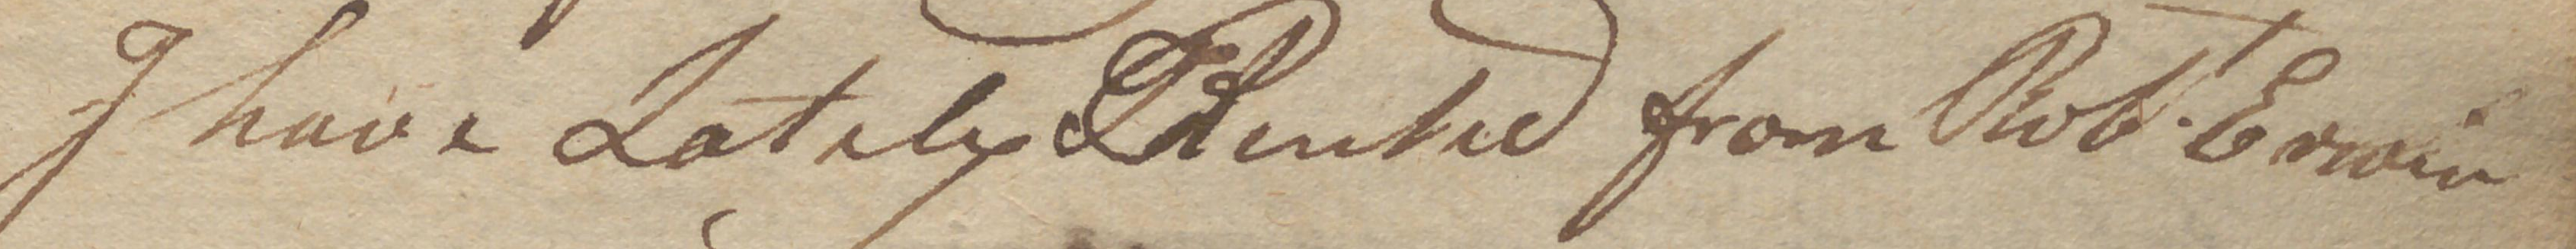I have Lately Rented from Rob^t Erwin
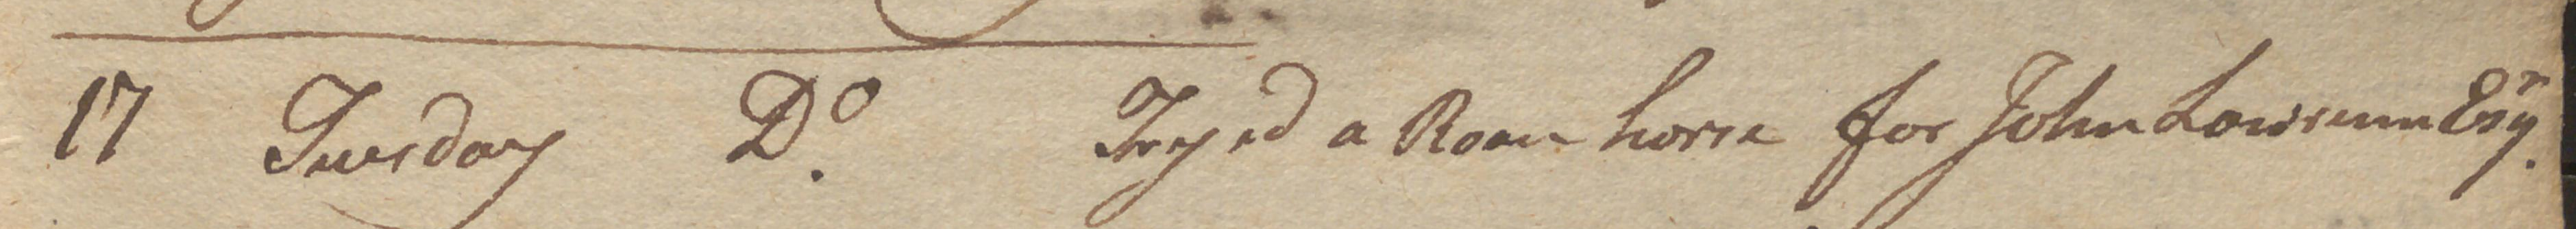17 Tuesday D^o Tryed a Roan horse for John Lawrence Esq^r.
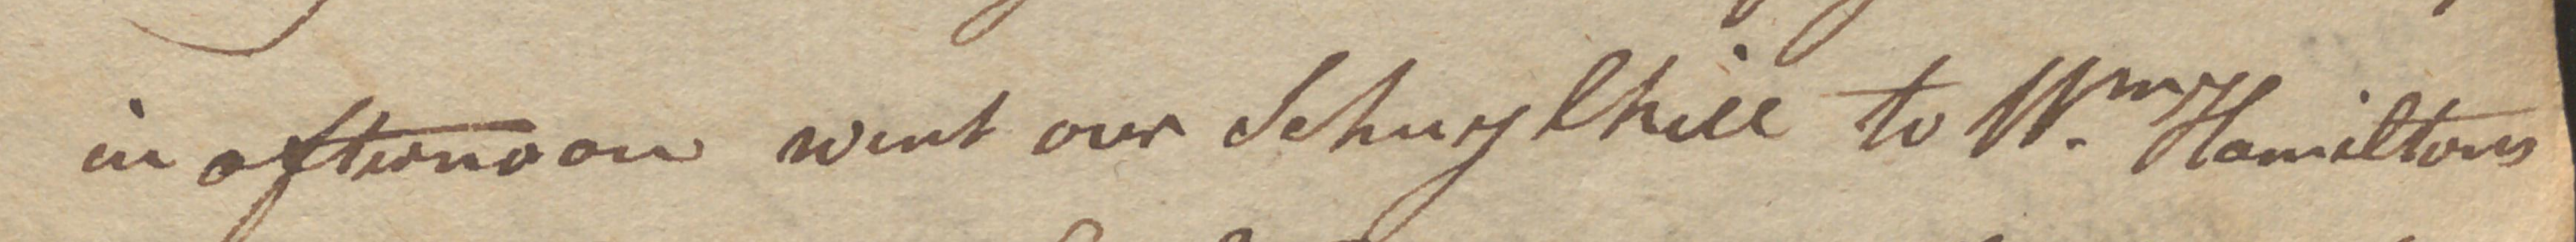in afternoon went our Schuylkill to W^m. Hamiltons
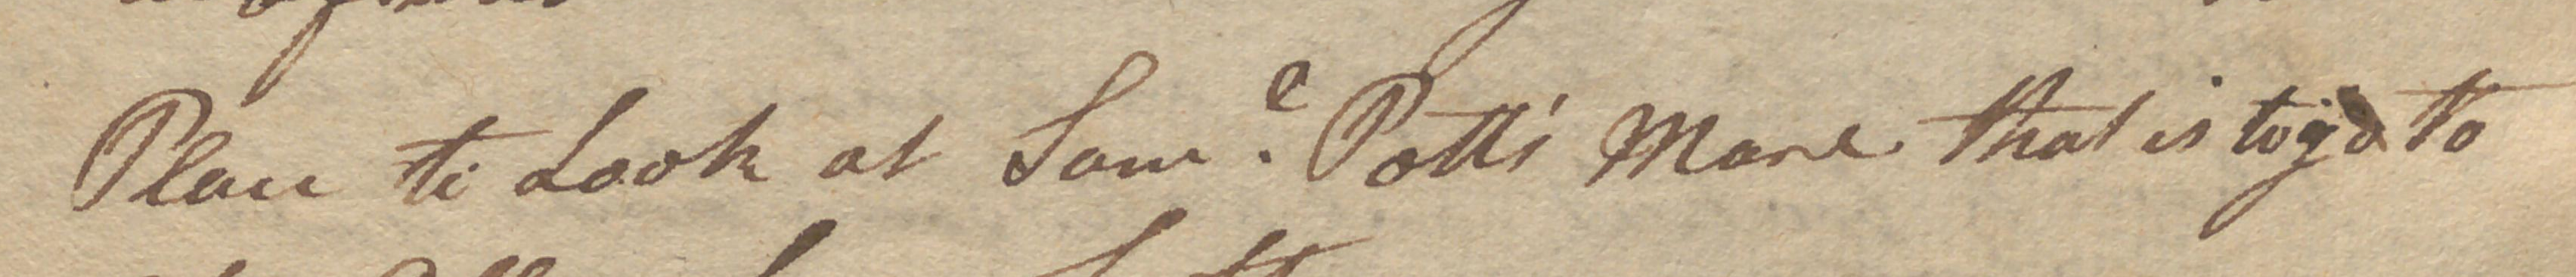Place to Look at Sam^l. Potts Mare that is to go to
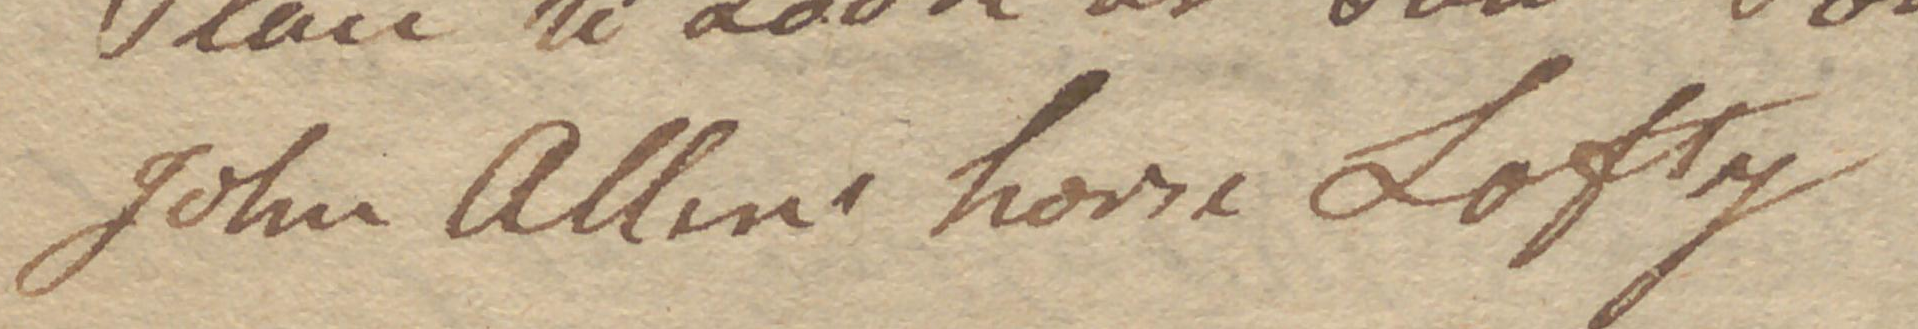John Allins horse Lofty
